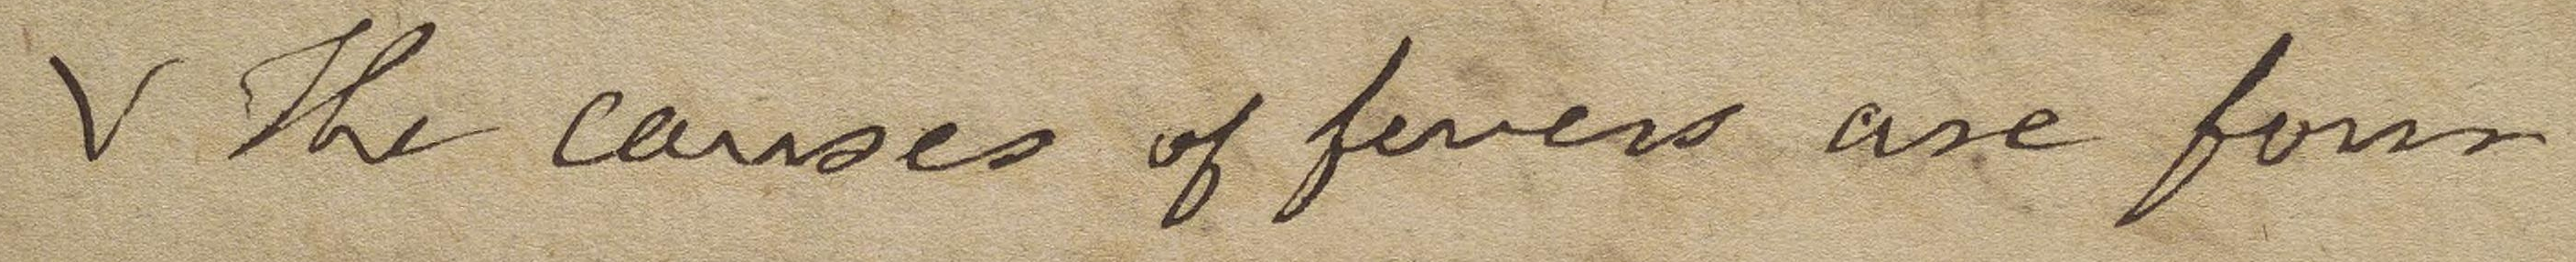V The causes of fevers are four
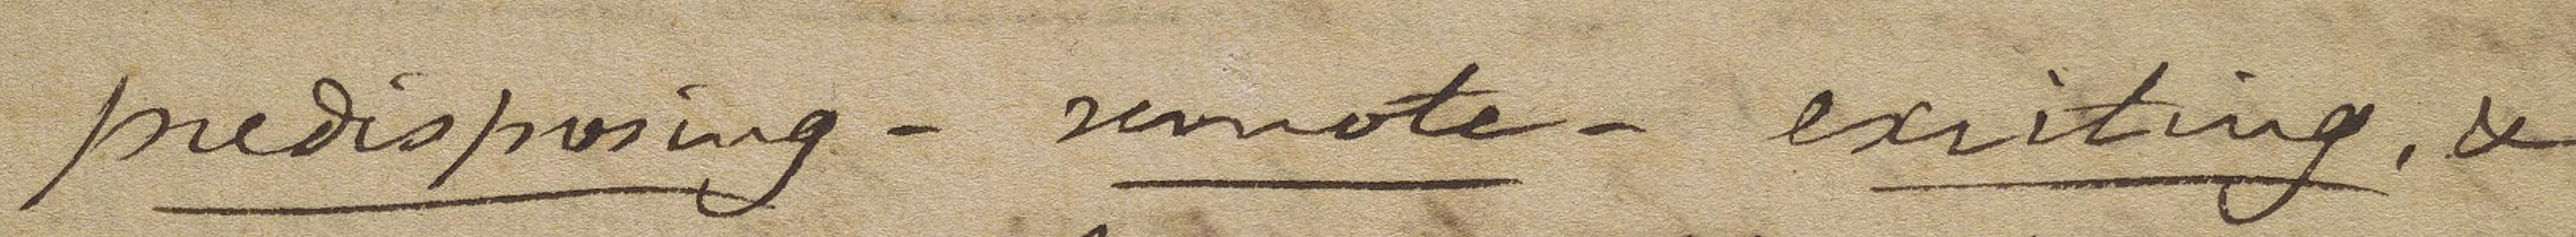predisposing- remote- exciting, &
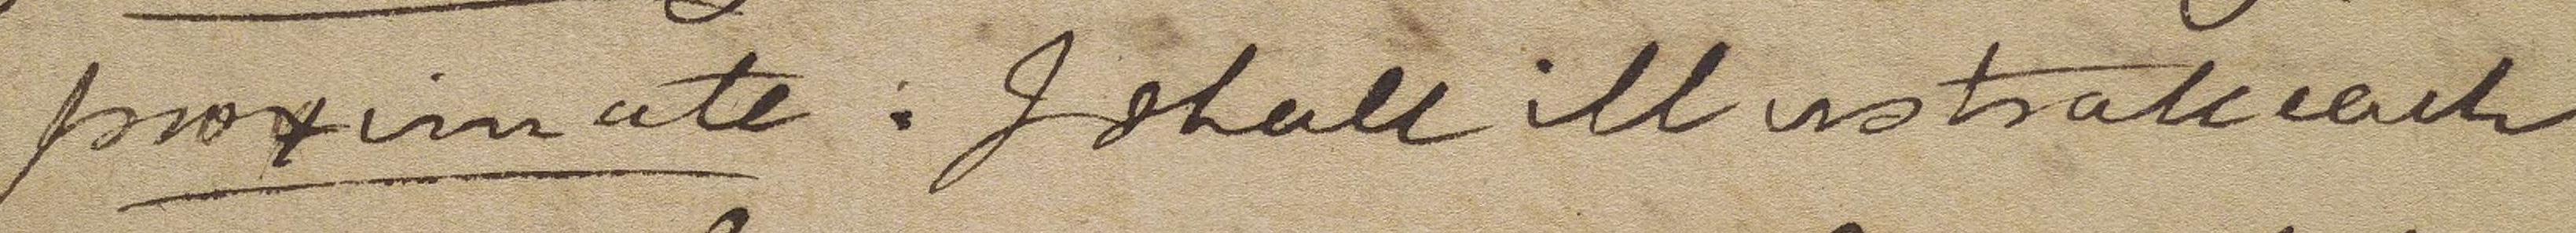proximate. I shall illustrate each
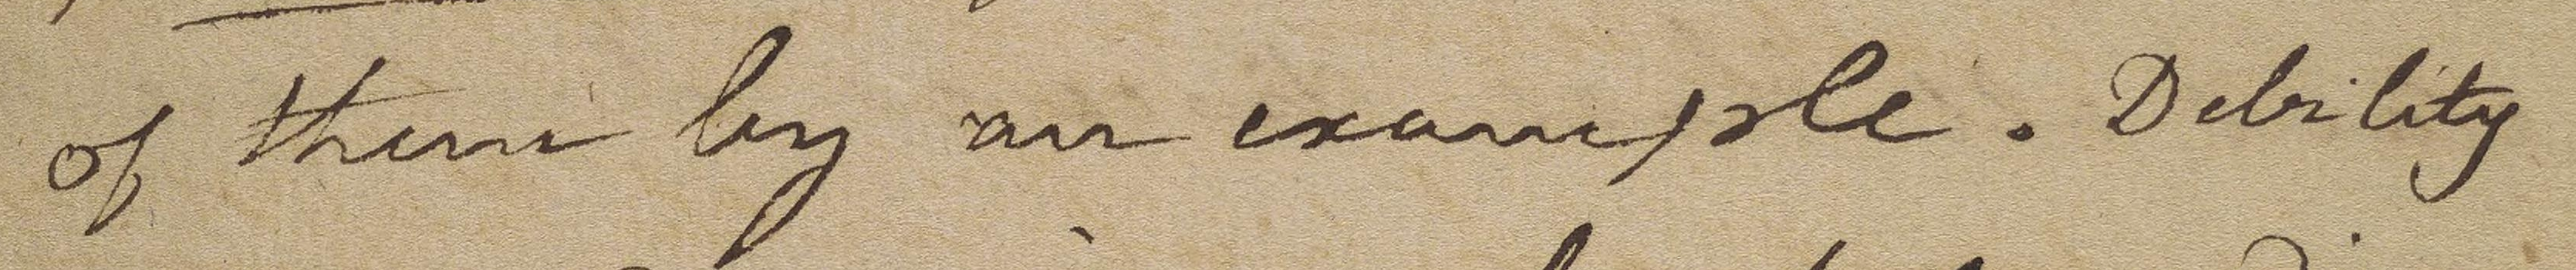of them by an example. Debility
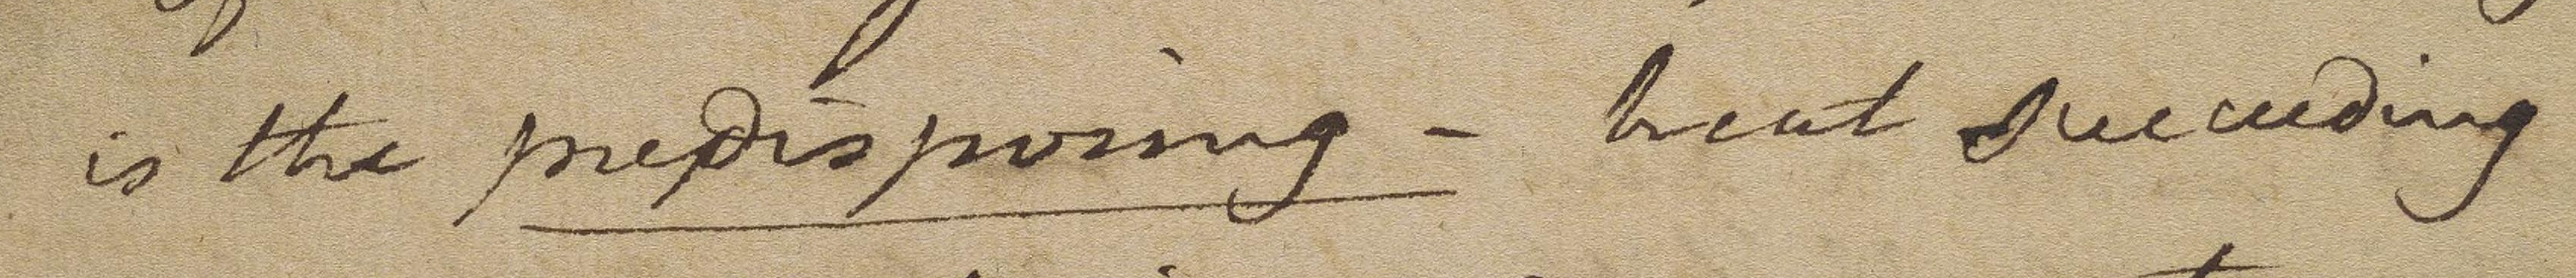is the predisposing- heat succeeding
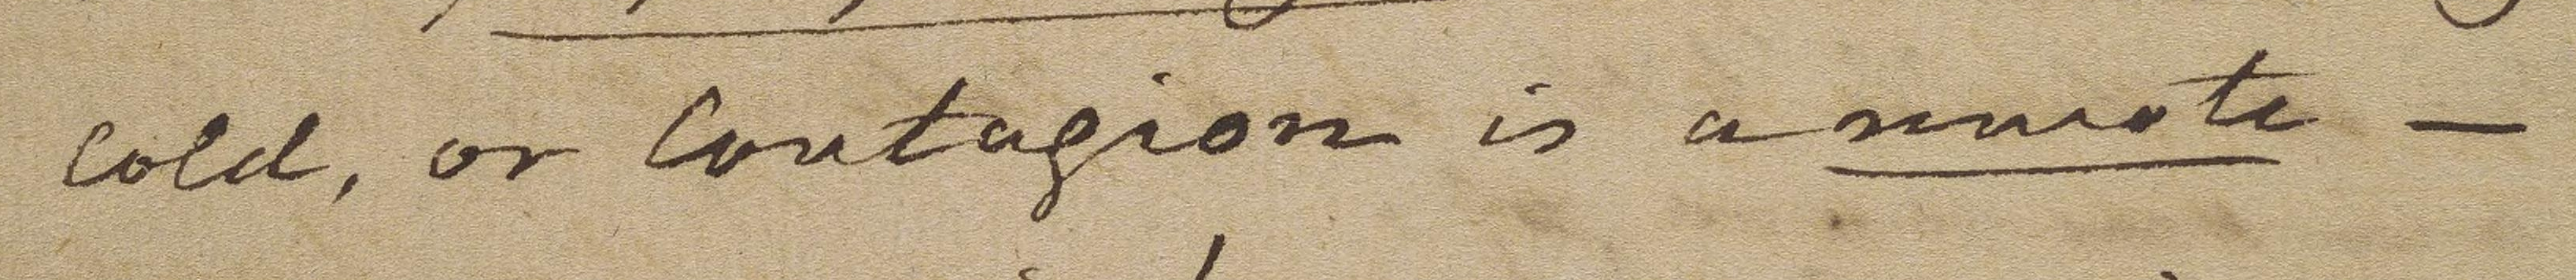cold, or contagion is a remote-
